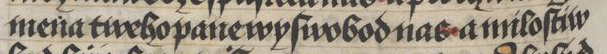mena tweho pane wyſwobod nas.a miloſtiw
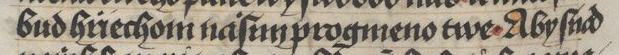bud hṙiechom naẛim progmeno twe.Aby ſuod
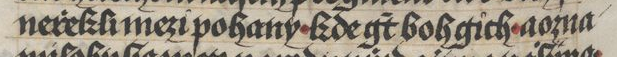neṙekli mezi pohany.kde ḡt boh gich.a ozna¬
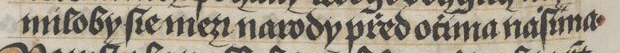miloby ſie mezi narody pṙed oċima naẛima.
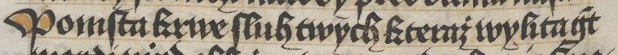Pomſta krwe ſluh twych kteraż wylita ḡt
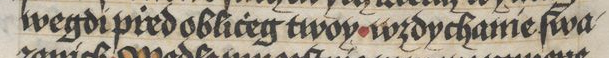wegdi pṙed obliċeg twoy.wzdychanie ſwa¬
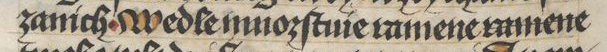zanich.Wedle mnozſtuie ramene ramene
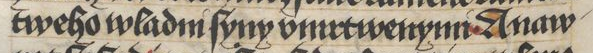tweho wladni ſyny vmrtwenymi.A naw¬
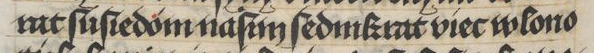rat ſuſiedóm naẛim ſedmkrat viec wlono
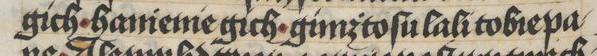gich.hanienie gich.gimżto ſu lali tobie pa¬
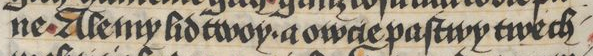ne.Ale my lid twoy.a owcie paſtwy twech¬
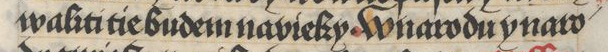waliti tie budem navieky.Wnarodu naro¬
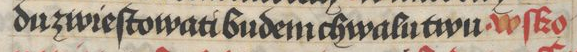du zwieſtowati budem chwalu twu.Wſko¬
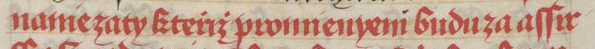naniezaty kteṙiż promienyeni budu za aſſir¬
